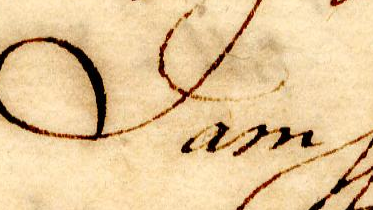I am
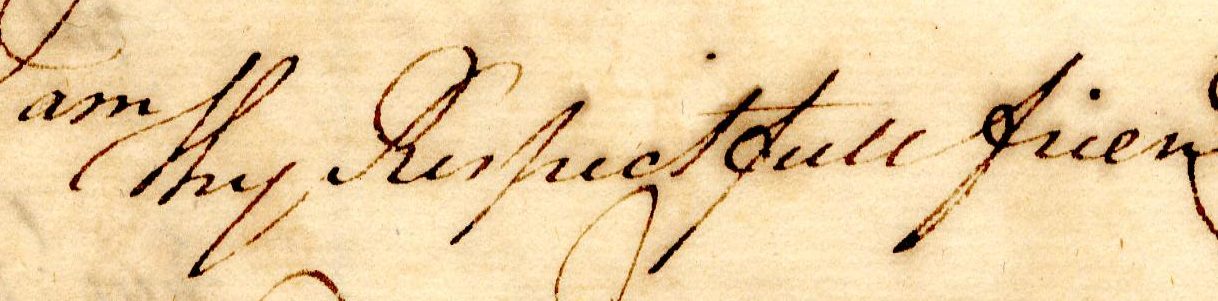Thy Respectfull friend
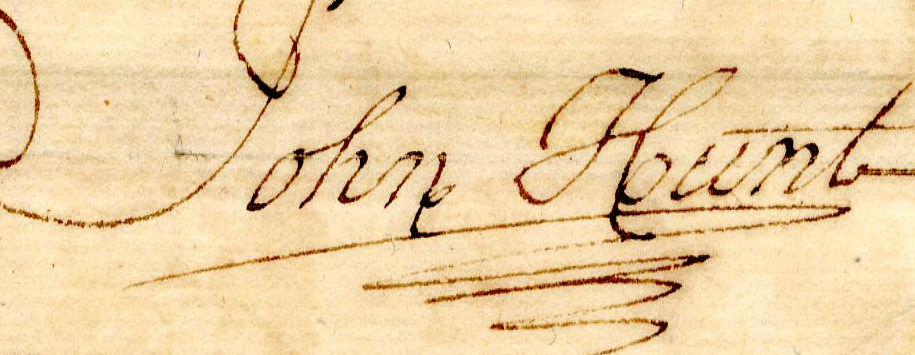John Hunt
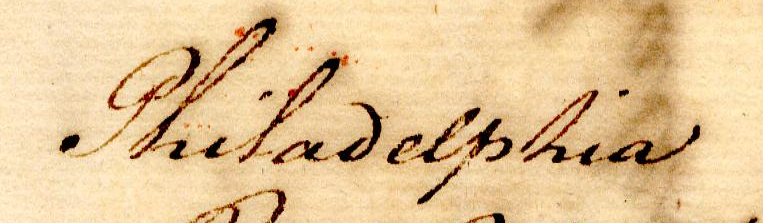Philadelphia
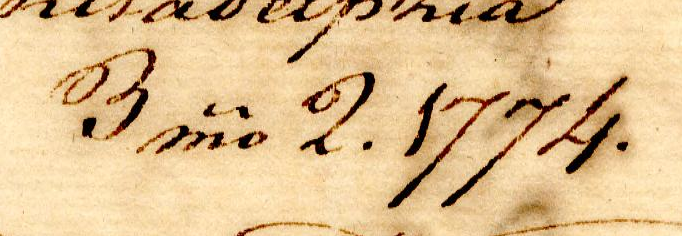3mo 2. 1774.
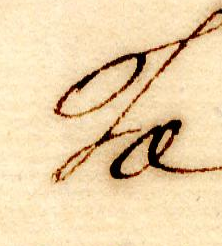To
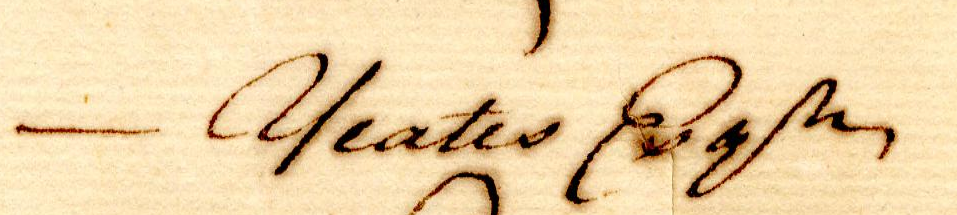Yeates Esq^r
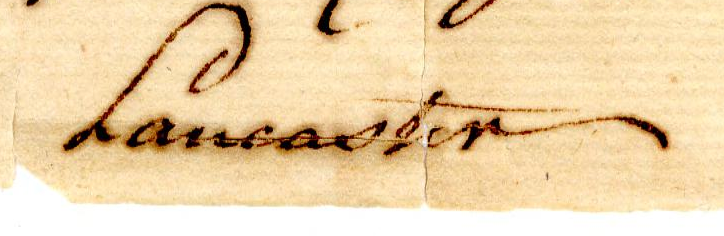Lancaster
